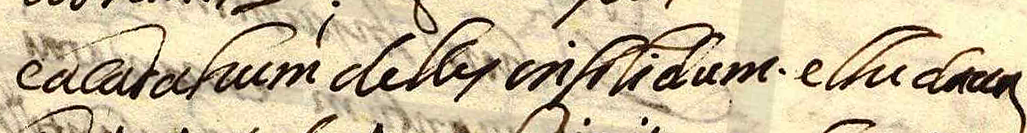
e a cada hum delles in solidum. e lhe daua
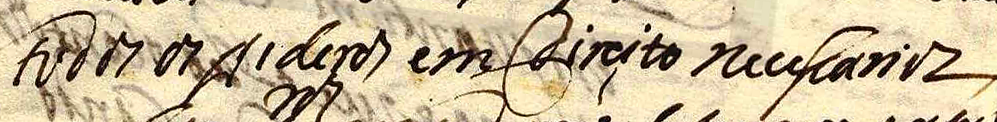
todos os poderes em Direito necessarioz
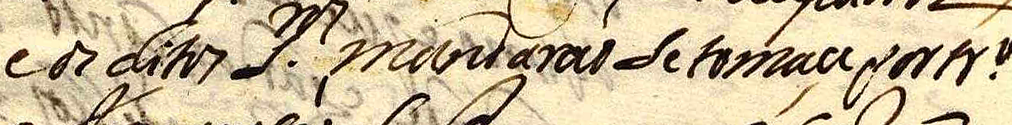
e os ditos S.res mandaraõ se tomaçe por tr.o
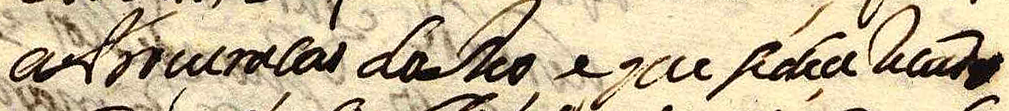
a Procuraçaõ do Reo, e que se deçe Recado
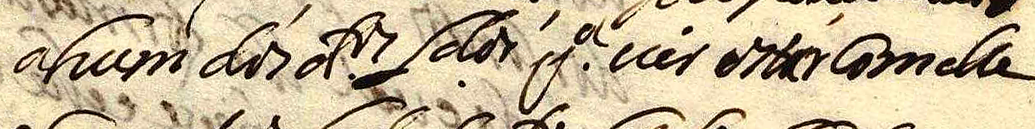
a hum dos d̄.os Ld.os pa. uir estar Com elle
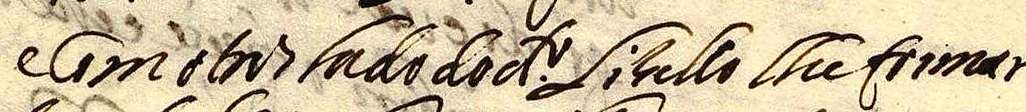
e com o treslado do d̄.to Libello lhe formar
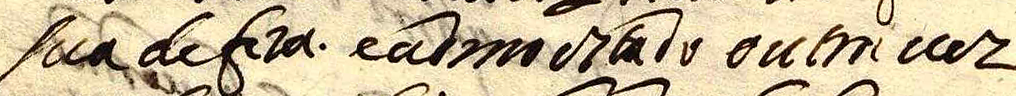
sua defeza. e admoestado outra uez
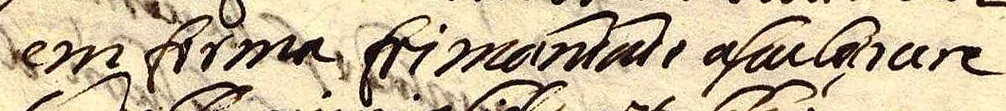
em forma foi mandado a seu Carcere
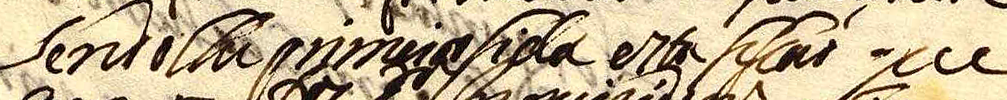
sendolhe primeiro Lida esta sessaõ que
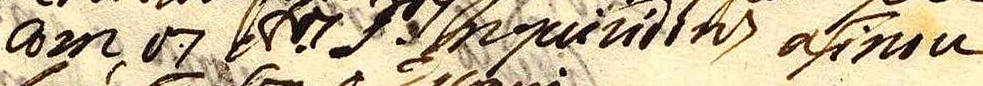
com os d̄o.s S.res Inquizidores asinou
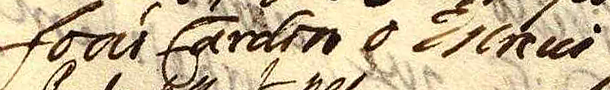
Joaõ Cardozo o Escreui
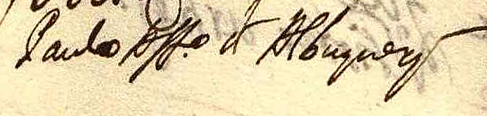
Paulo Aff.o d̄ Albuquerq̄
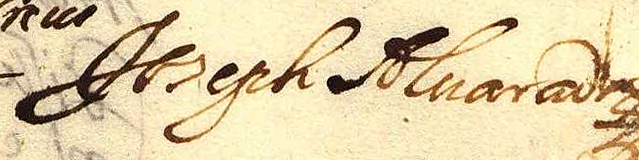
Joseph Aluarado
